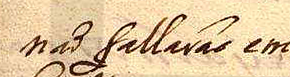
naõ fallarão em
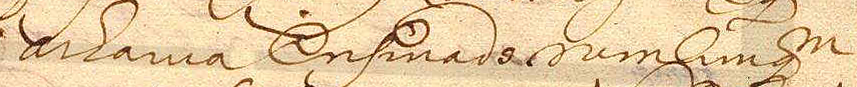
as hauia Ensinado nem Com qm
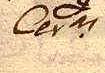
Cer.as
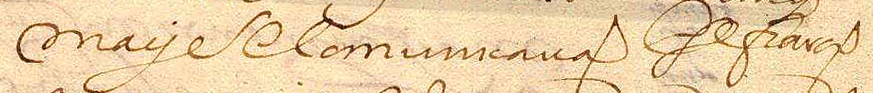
mais Se comunicauaꝭ se fiaraꝭ
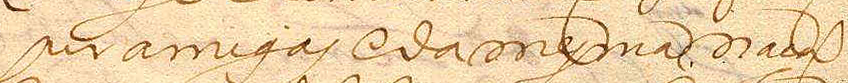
per amigas e da mesma naçaꝭ
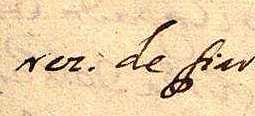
rez. de fiar
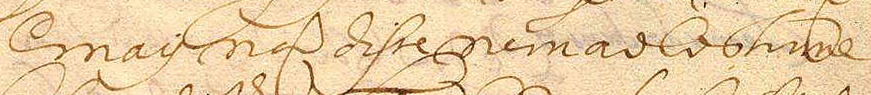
E mais naꝭ disse nem ao Costume
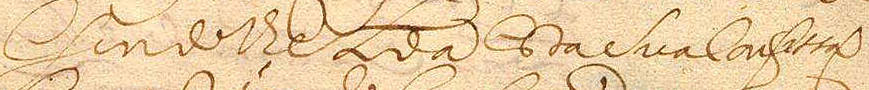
E sendolhe Lida esta Sua Confissaꝭ
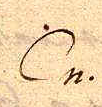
Cn.
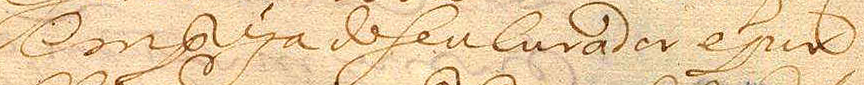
Em pReza do seu Curador e per
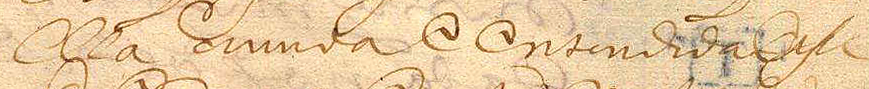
Ella ouinda e entendida Disse
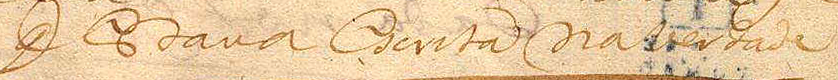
q̄ estaua Escrita na verdade
